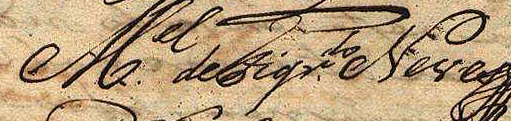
M.el de Figr.do Neves
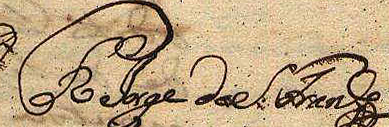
Fr Iorge de S. Fran.co
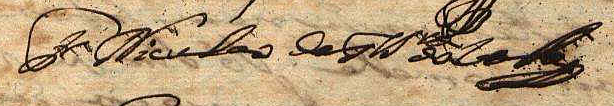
Fra Niculao da Nsra do Valle
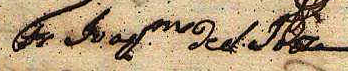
Fr Ioaq.m de S. Ioze
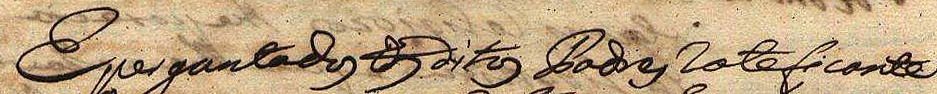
E perguntados os ditos Padres Rateficante
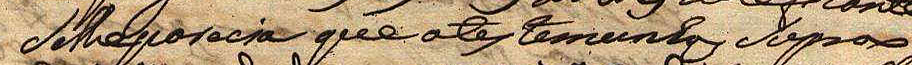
se lhe parecia que a testemunhas supras
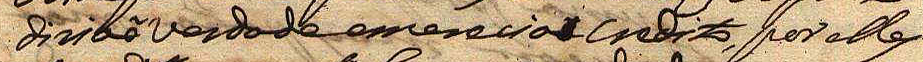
diziaõ verdade e mereciaõ credito, por elles
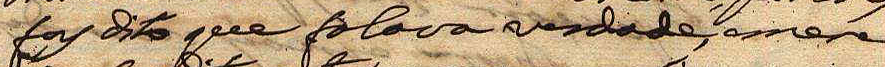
foy dito que falava verdade, e mere
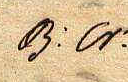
B: cr:
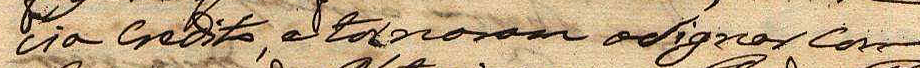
cia credito, e tornaram asignar com
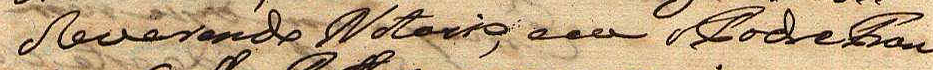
Reverendo Notario, e eu o Padre Fran
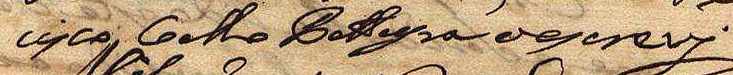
cisco, Coelho Petteyra o escrevj
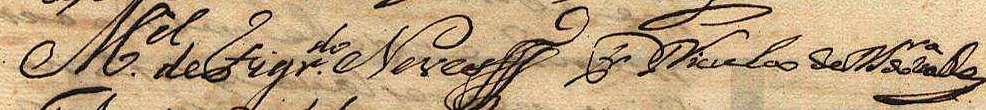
M.el de Figr.do Neves Fr Niculao de Nsra do valle
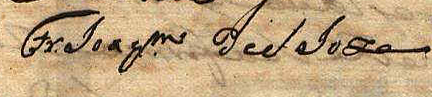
Fr Ioaq.m de S Ioze
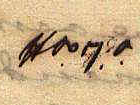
tta. 7.a
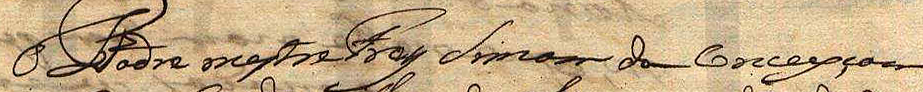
O Padre mestre Frey Simam da Conceyçam
